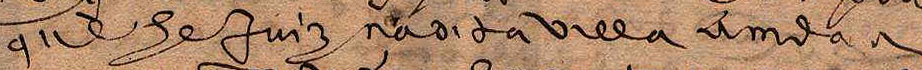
que he Juiz na dita villa amdam
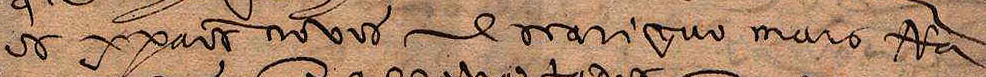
os xpaõs novos descariguo mais ffa
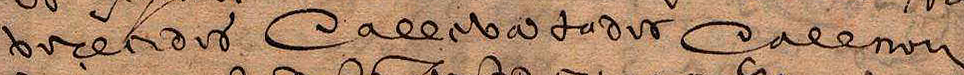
vorecidos e allavātados e all nom
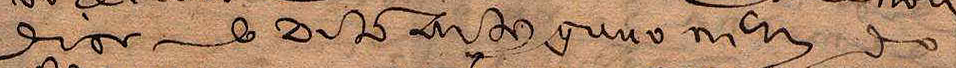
dise do Dito artyguuo nem do
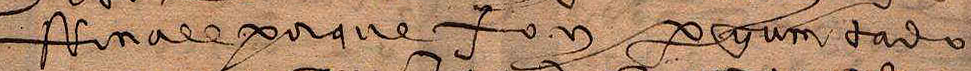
ffinall porque foy ꝑgumtado
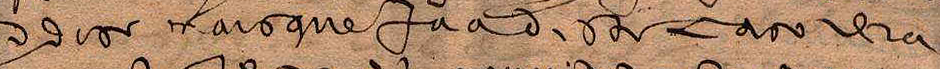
e dise mais que Jaa deste caso dera
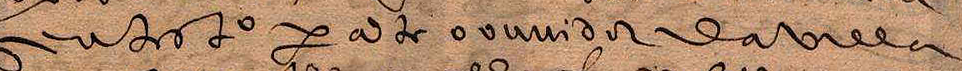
seu testo ꝑāte o ouuidor da villa
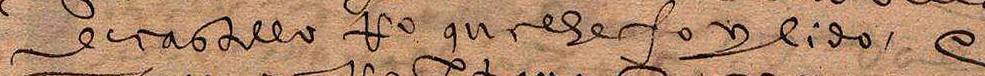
de castello Ro que lhe foy lido / e
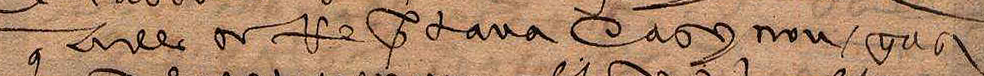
q̄ a elle se Rep̄otaua e asynou / gas
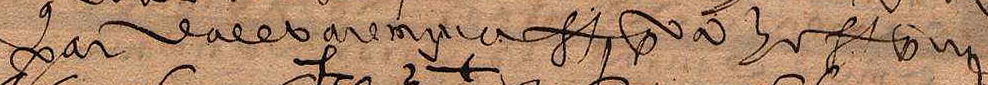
par dallvaremgua stp̄vā ho stp̄vj
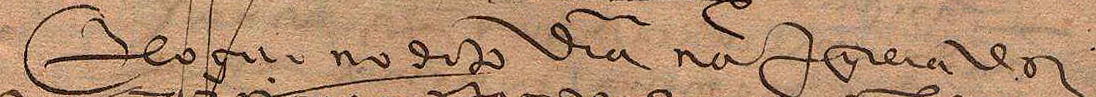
E loguo no dito dia na Jgreia des
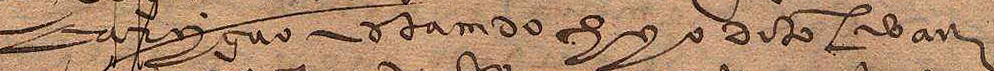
Caryguo estamdo hy o dito Ldo am
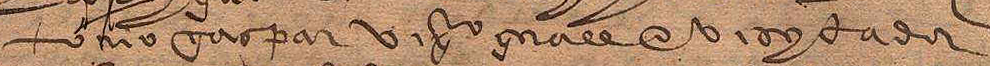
tonio gaspar vigro gerall e visytador
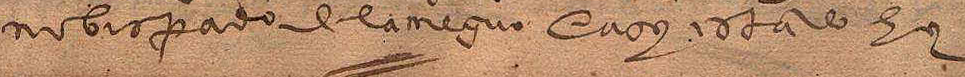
no bispado de lameguo e asy estādo hy
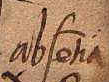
absētia
